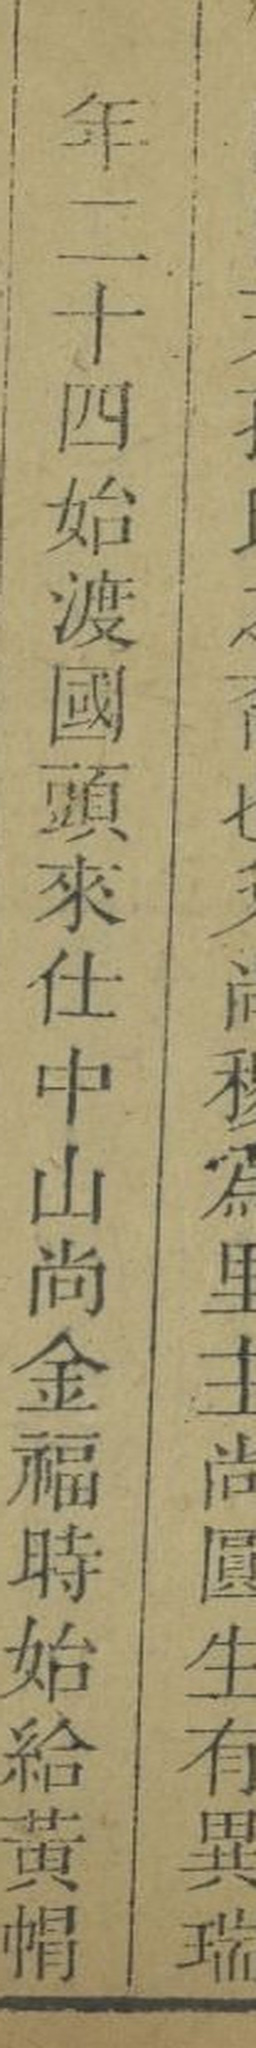年二十四始渡国頭来仕中山尚金福時始給黄帽
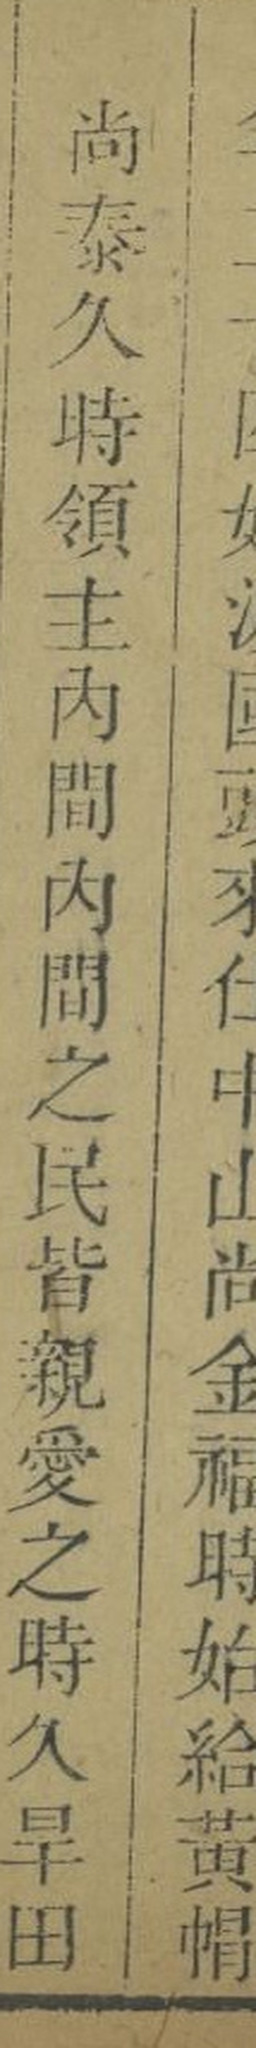尚泰久時領主内間内間之民皆親愛之時久旱田
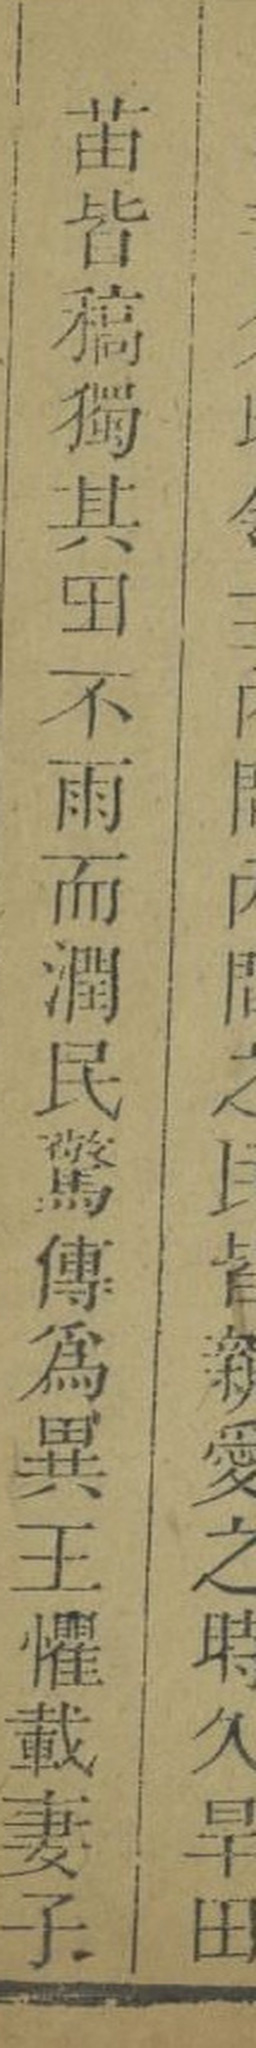苗皆稿独其田不雨而潤民驚伝為異王懼載妻子
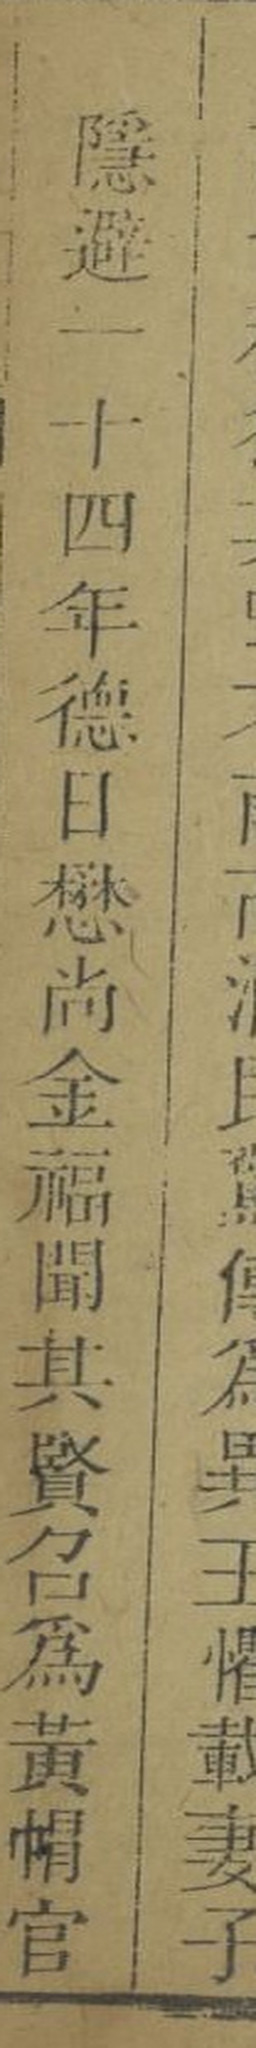隠避一十四年徳日懋尚金福聞其賢召為黄帽官

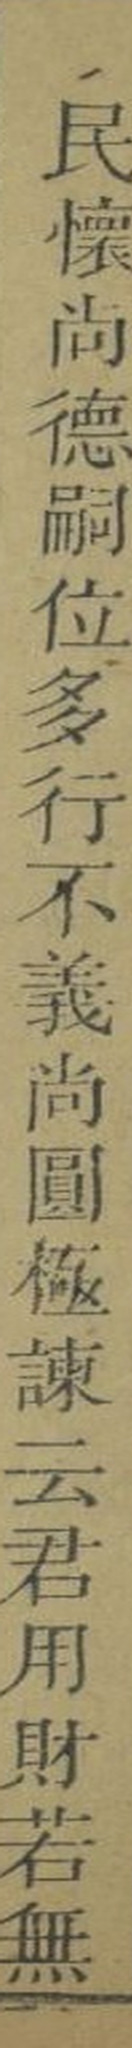民懐尚徳嗣位多行不義尚円極諫云君用財若無
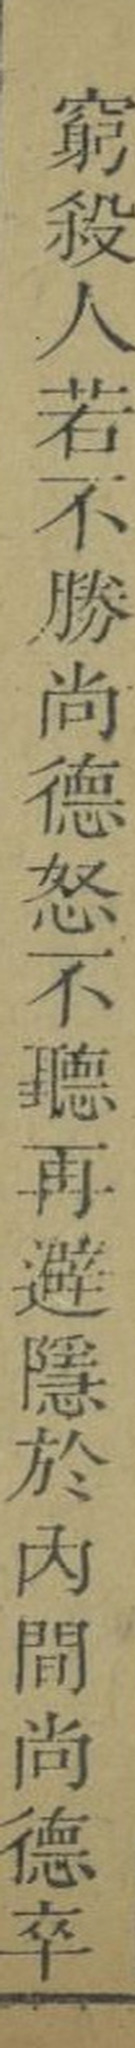窮殺人若不勝尚徳怒不聴再避隠於内間尚徳卒
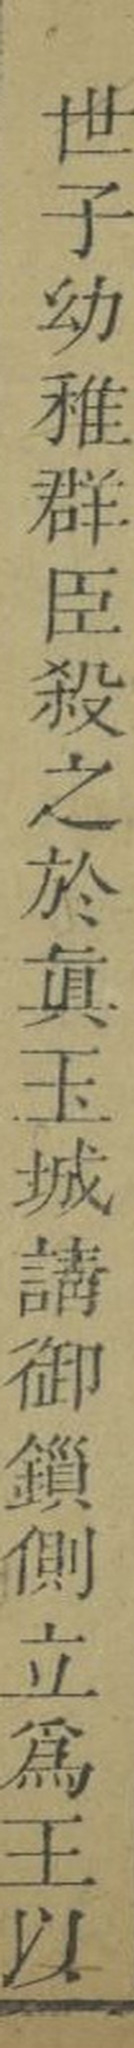世子幼稚群臣殺之於真玉城請御鎖側立為王以
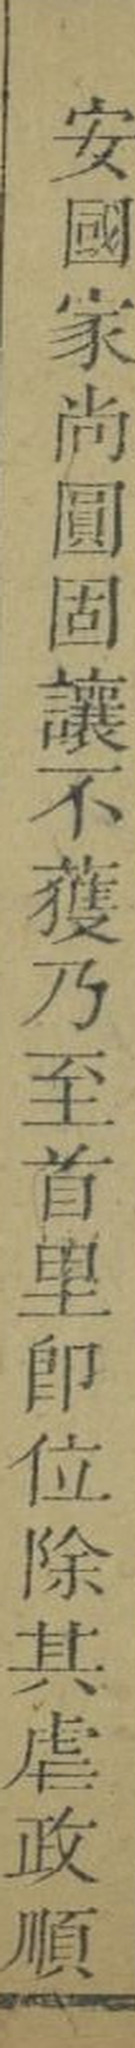安国家尚円固譲不獲乃至首里即位除其虐政順
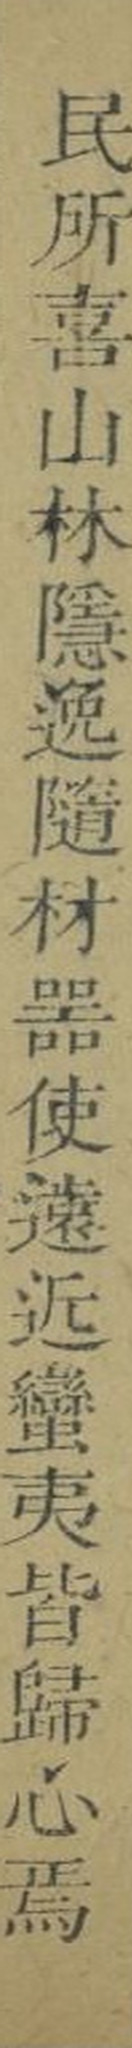民所喜山林隠逸随材器使遠近蛮夷皆帰心焉
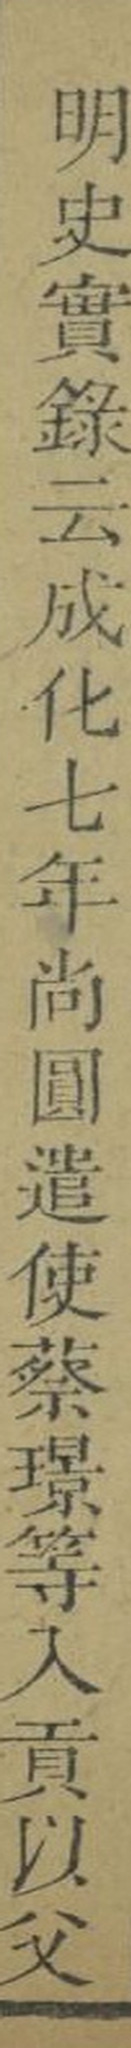明史実録云成化七年尚円遣使蔡璟等入貢以父
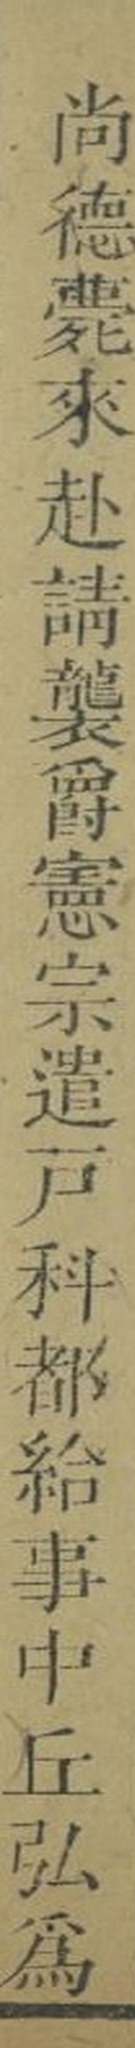尚徳薨来赴請襲爵憲宗遣戸科都給事中丘弘為
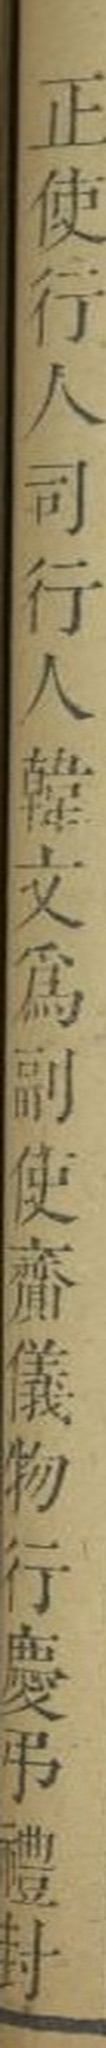正使行人司行人韓文為副使齎儀物行慶弔礼封
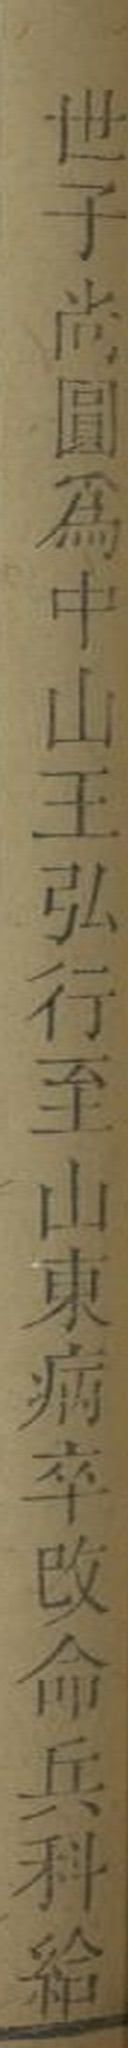世子尚円為中山王弘行至山東病卒改命兵科給
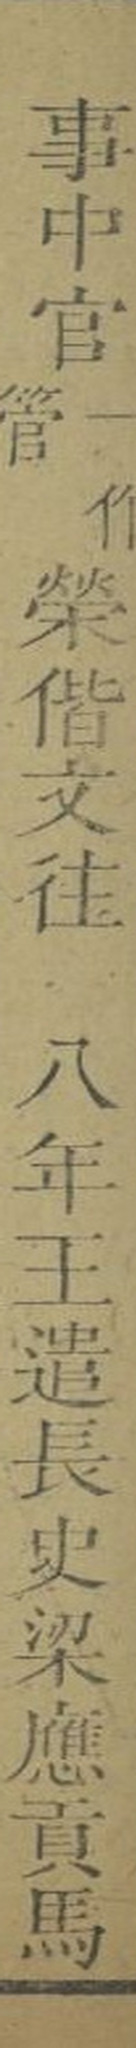事中官一作管栄偕文往八年王遣長史梁応貢馬
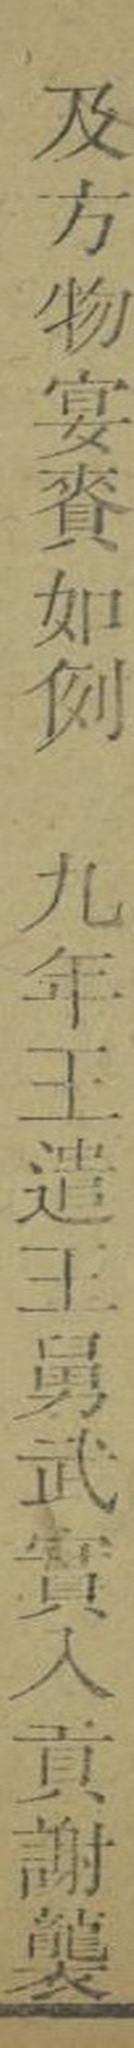及方物宴賚如例九年王遣王舅武実入貢謝襲
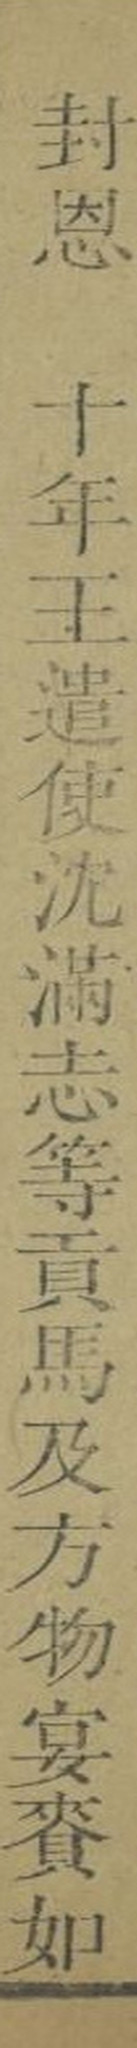封恩十年王遣使沈満志等貢馬及方物宴賚如
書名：中山伝信録 巻三
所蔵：University of the Ryukyus Library
